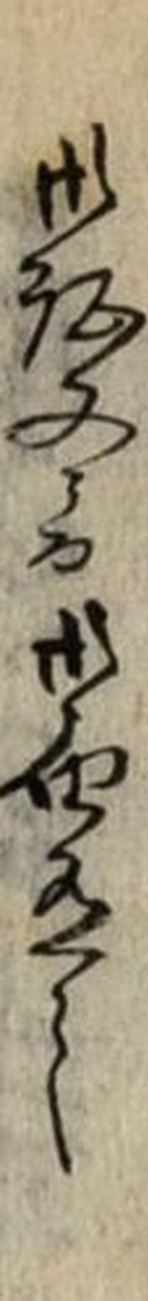御証文にて御届有之
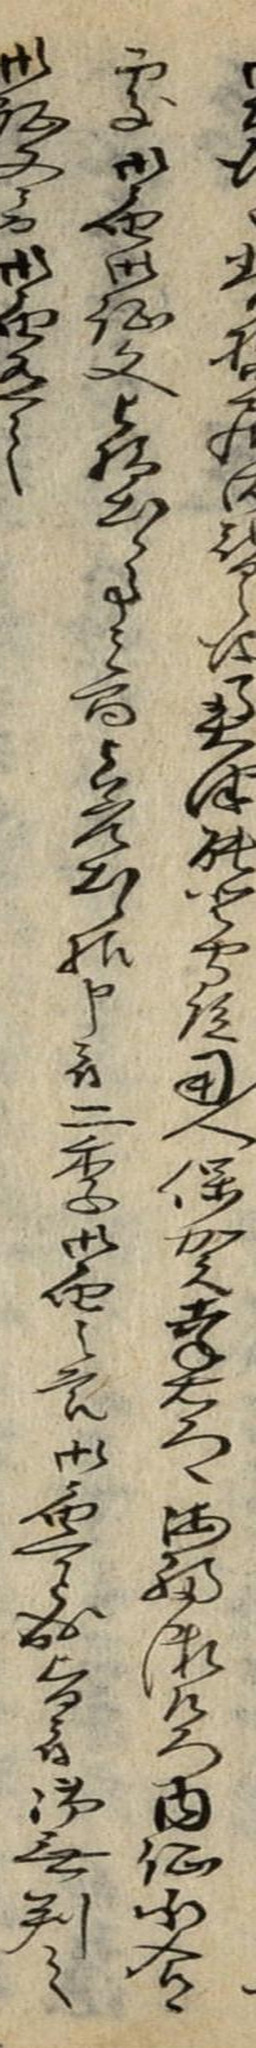処御届御証文被指出候事に候間被差出候様申に付二季御届之節御届可被成旨に付御無判之
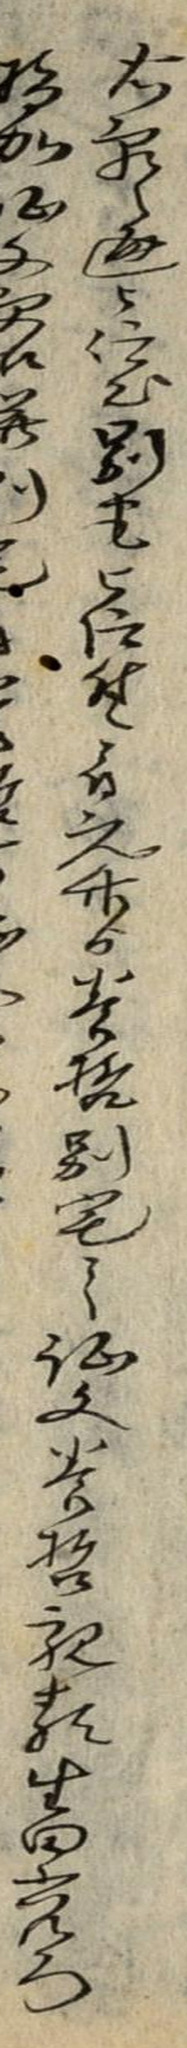右願之通被仰出別宅被仰付候に付元竹ゟ養哲別宅之証文養哲親類生田六左衛門
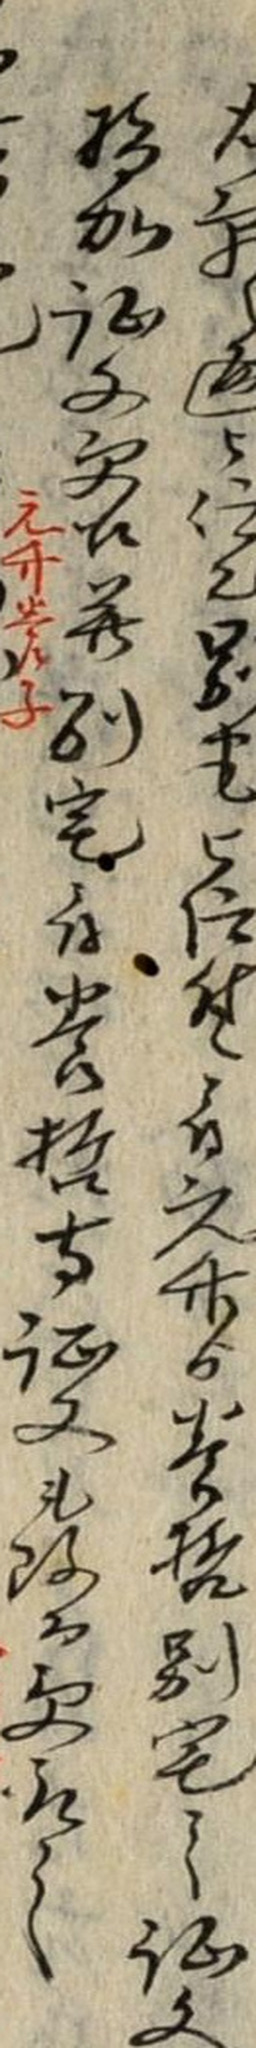指加証文受取并別宅に付養哲寺証文も改て受取之
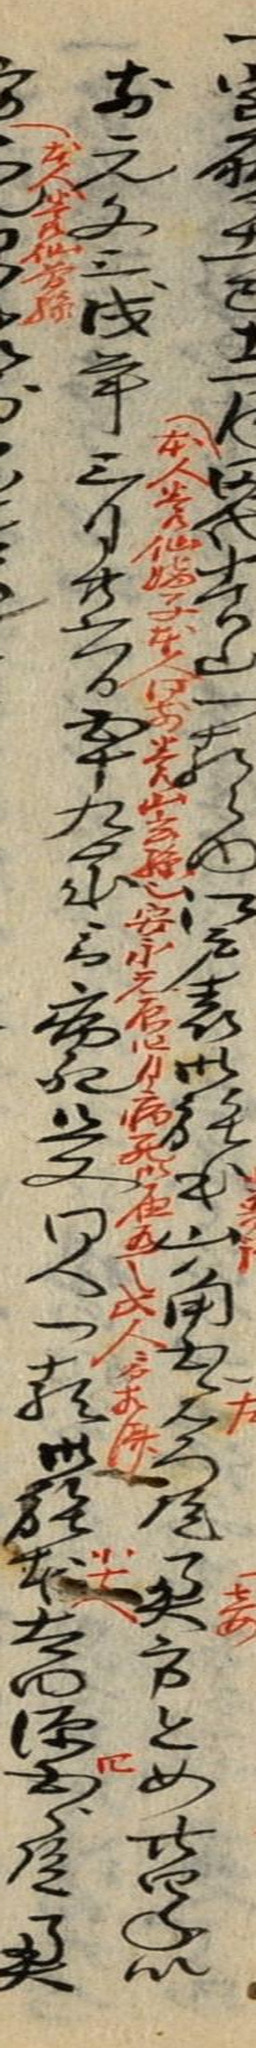前元文三戌年三月廿六日五十九歳にて病死且又同人一類御旗本太田源五郎殿奥
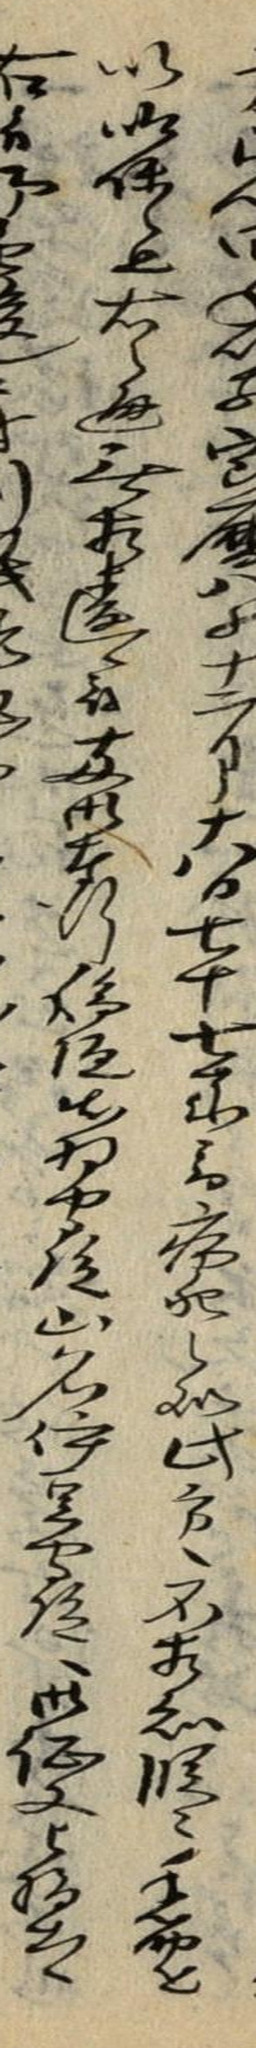以吟味之上右之通無相違候に付両御奉行稲垣出羽守殿山名伊豆守殿へ御証文被指出候
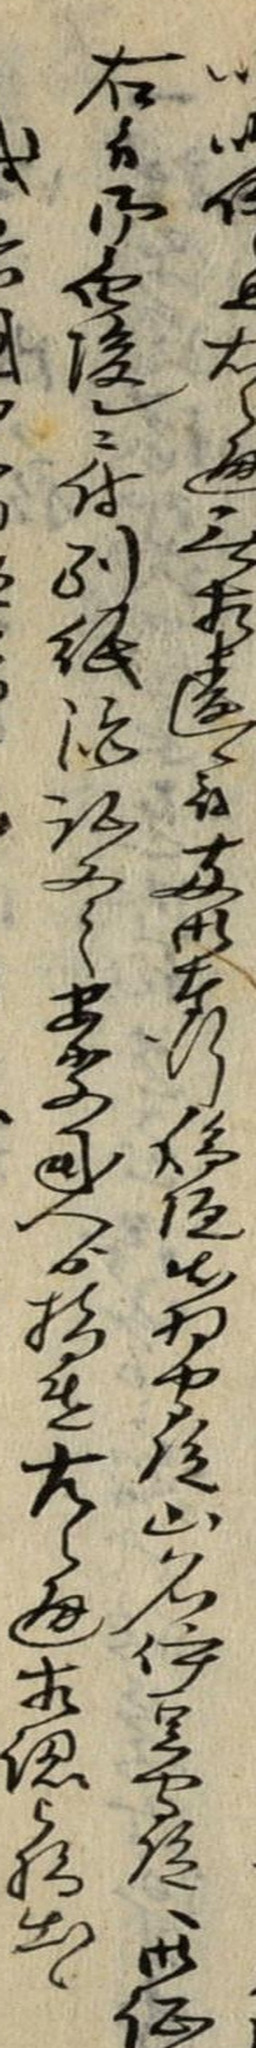右に付御届後レに付別紙添証文之案文用人ゟ指遣左之通相認被指出候
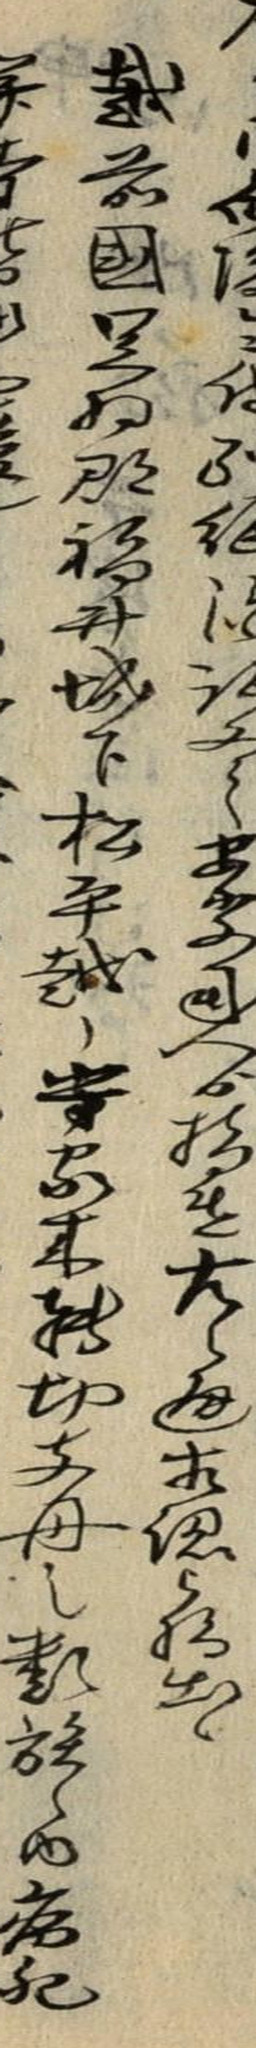越前国足羽郡福井城下松平越―守家来転切支丹之類族之内病死
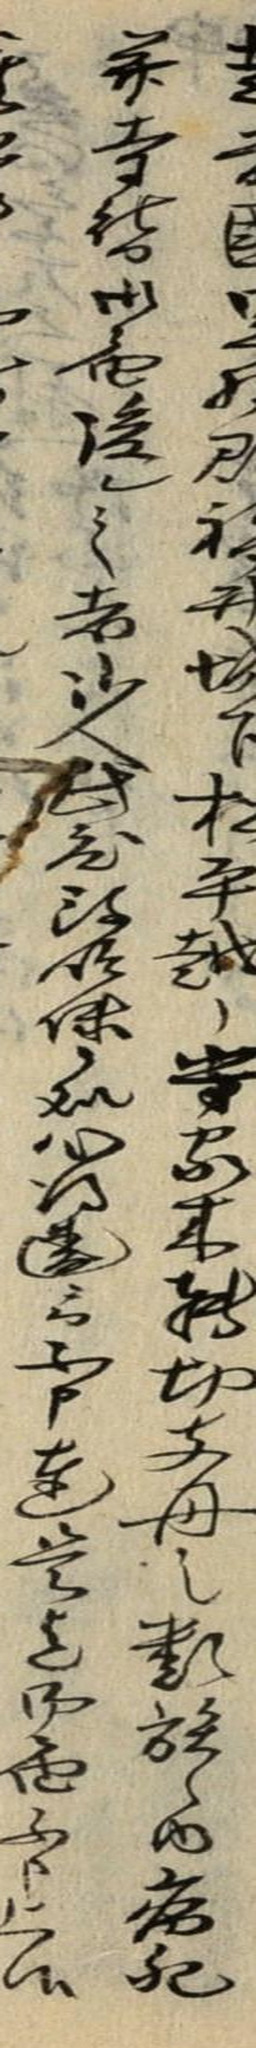并寺替御届後レ之者弐人此度致吟味候処心得違にて不申達是迄御届不申上候
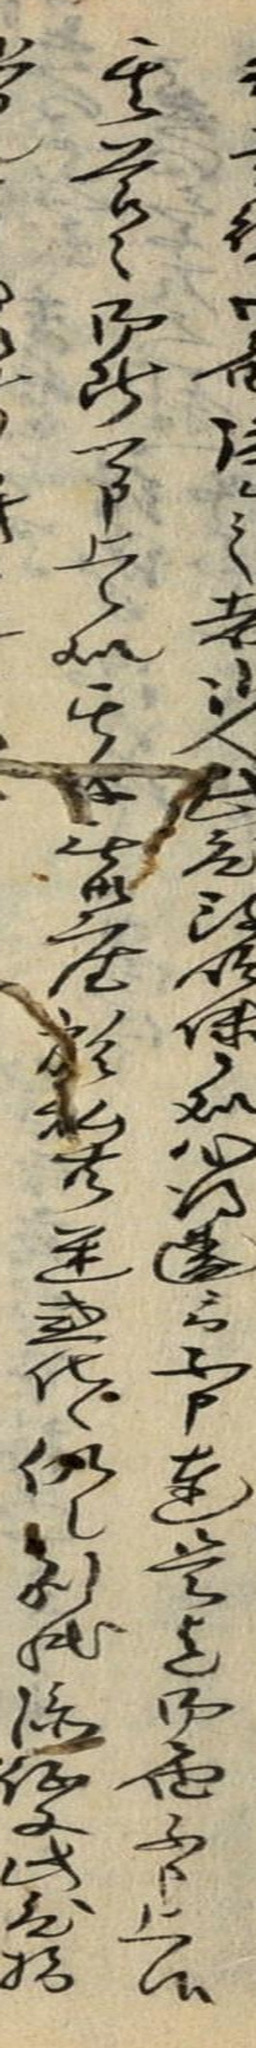其節之御断可申上候処其儀無御座於私共迷惑仕候仍之別紙添証文此度指
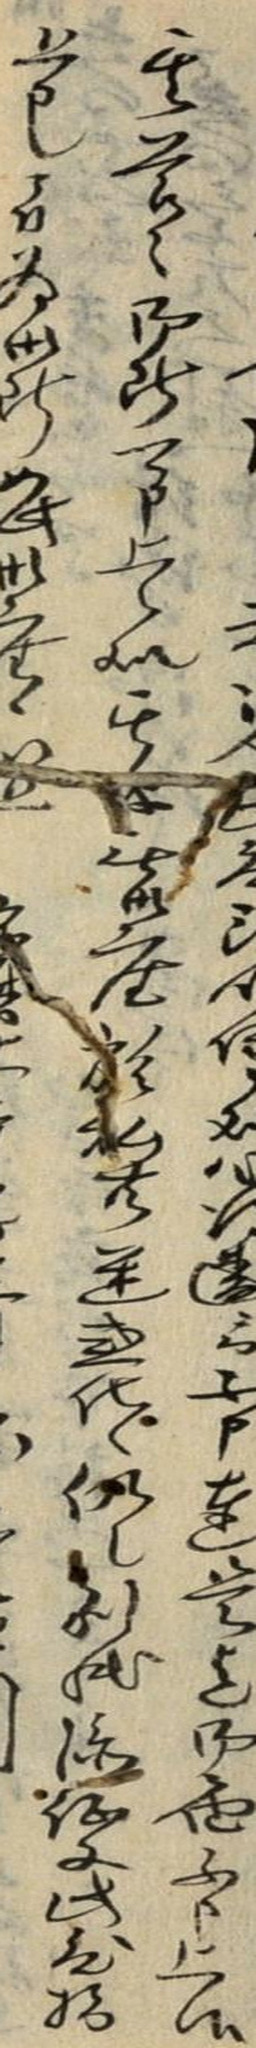其節之御断可申上候処其儀無御座於私共迷惑仕候仍之別紙添証文此度指
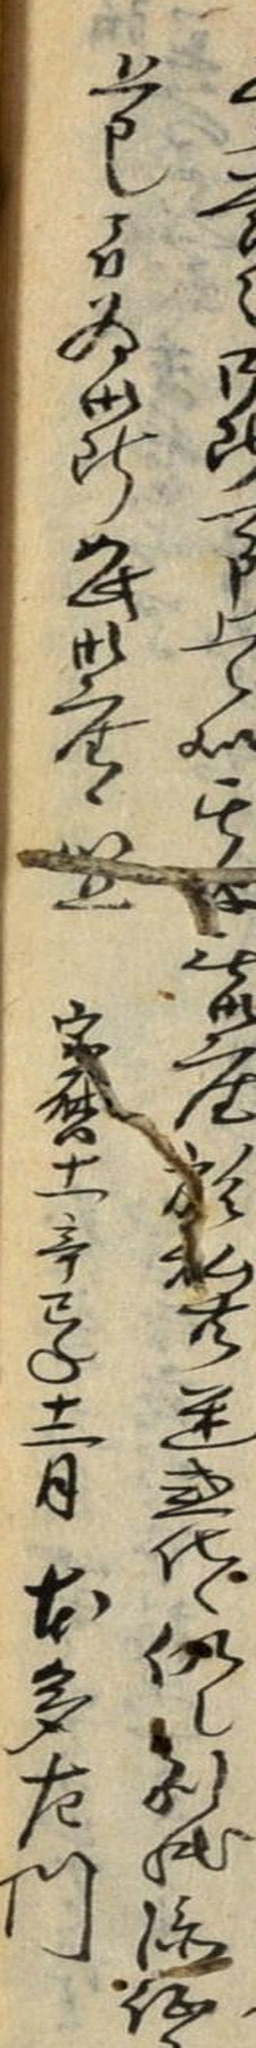上申候に付為御断如此御座候以上宝暦十一辛巳年十二月本多左門
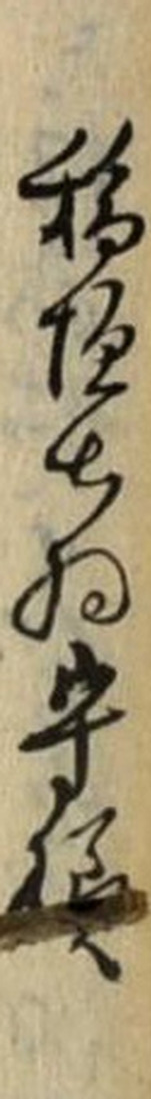稲垣出羽守様
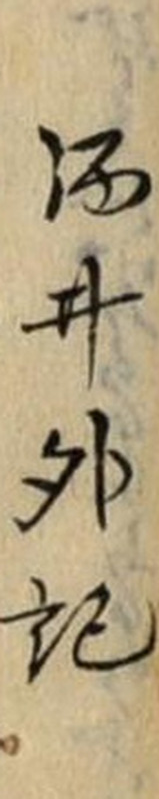酒井外記
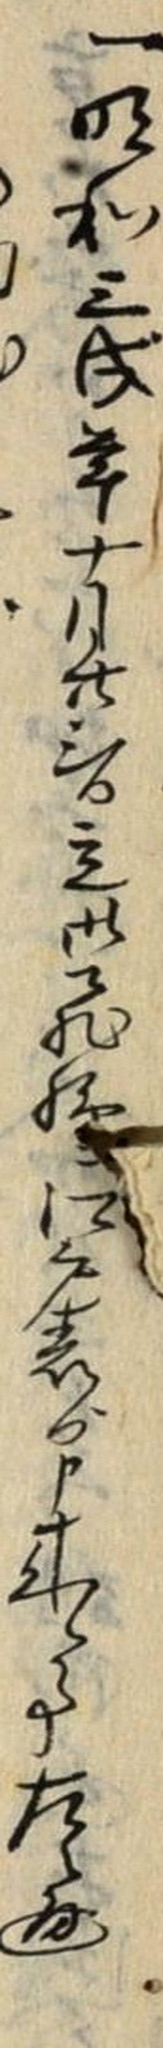一明和三戌年十月廿三日立御飛脚江戸表ゟ申来候事左之通
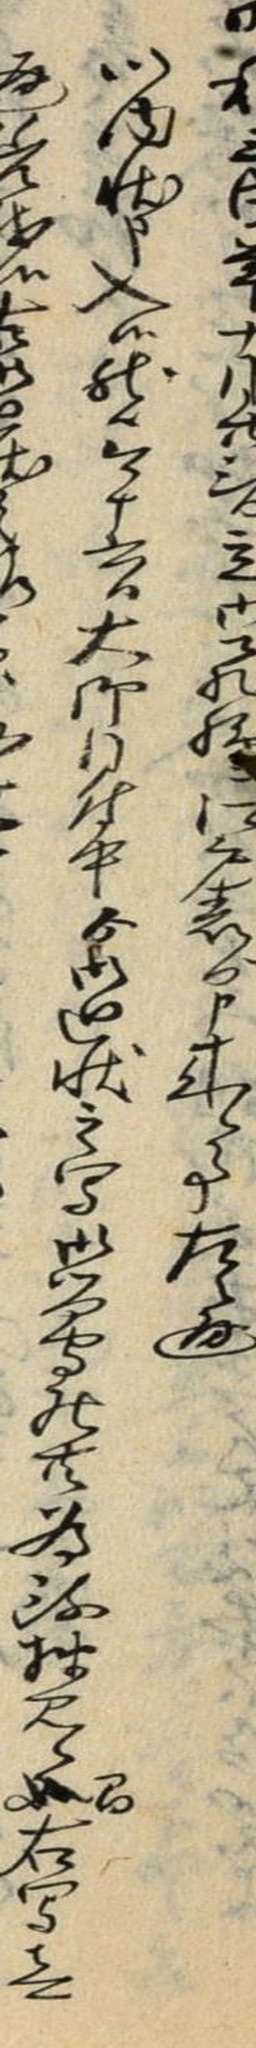以内状申入候然は今十六日大御目付中ゟ御廻状之写御留守居共為致披見候処間右写壱
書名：御停止異変死失
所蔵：福井県文書館 Fukui Prefectural Archives
